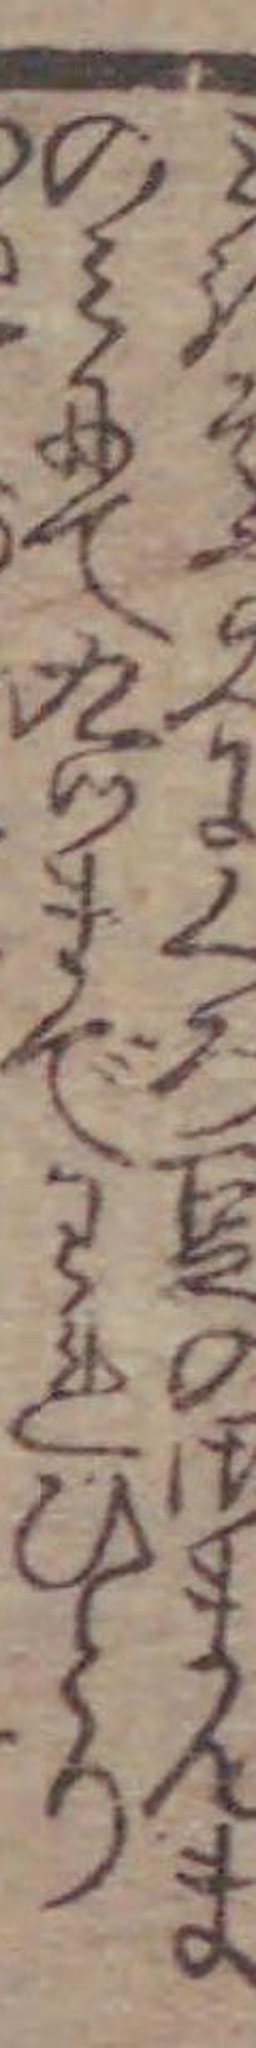のみにて九つまでわれひとり
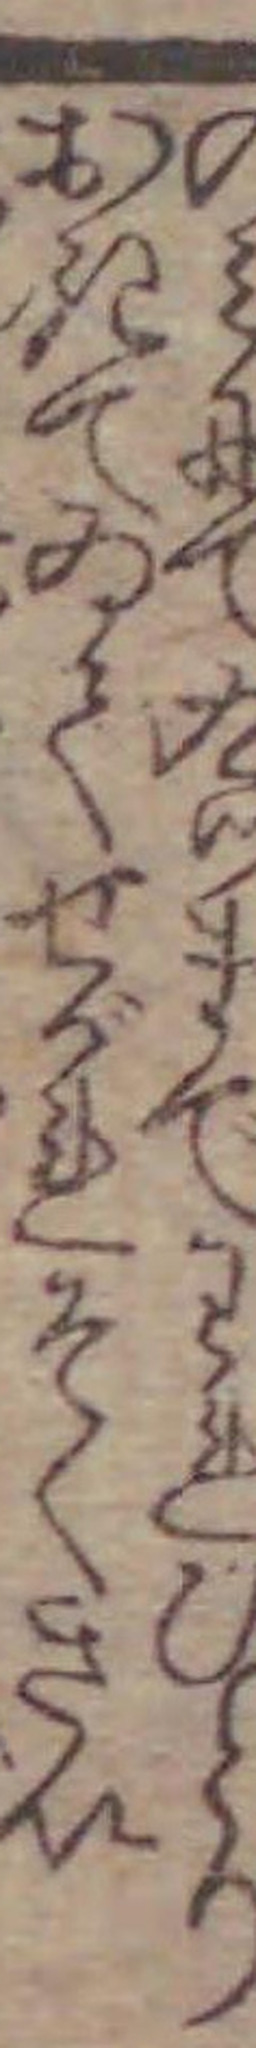おきてゐてせがれそくさい
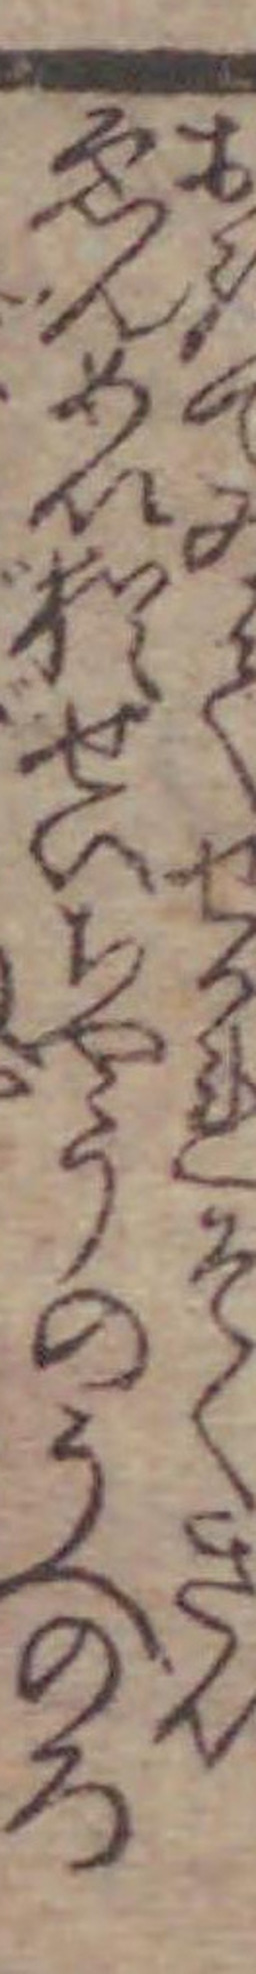ゑんめい猶せいちやうのうへのろ
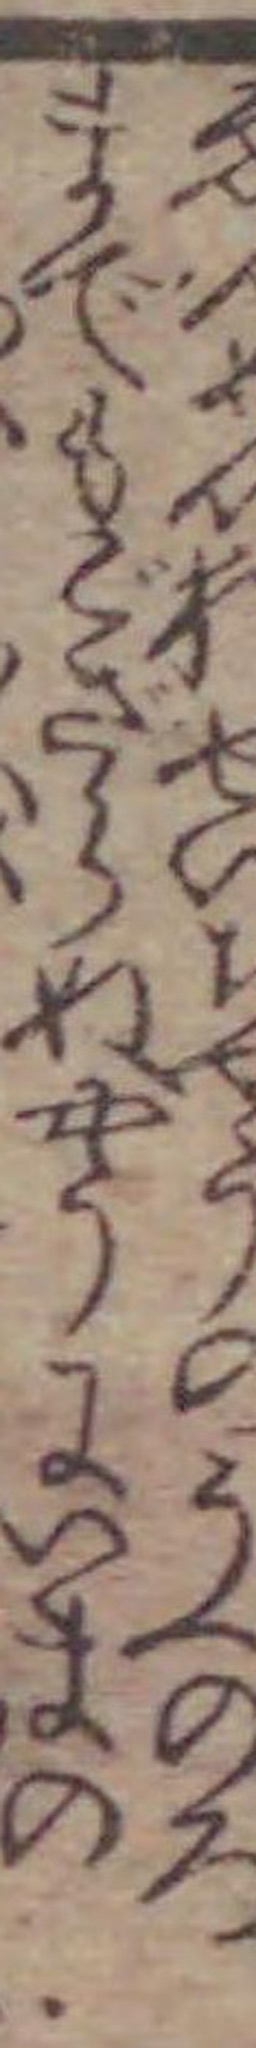までもござらぬやうにいまの
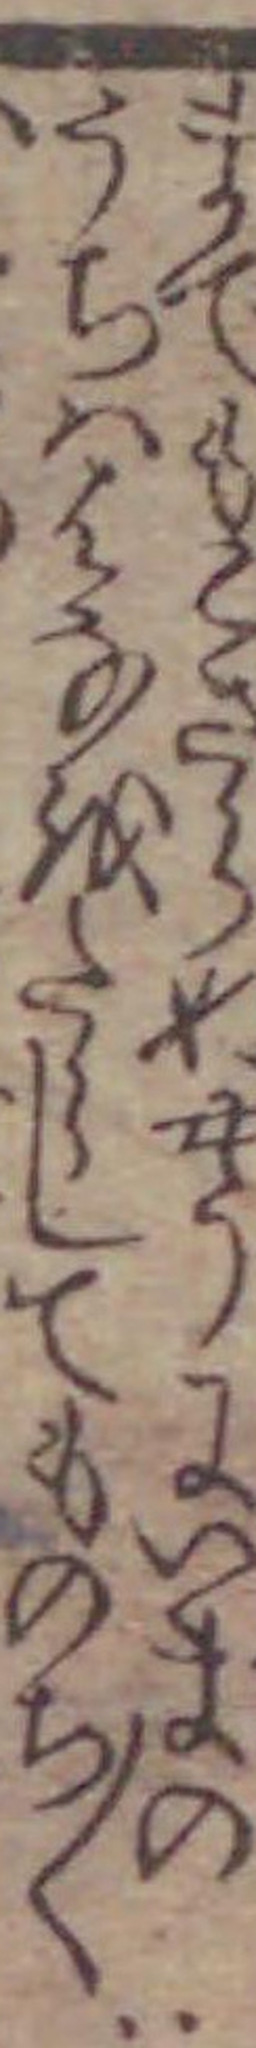うちははなをたらしてものち〳〵
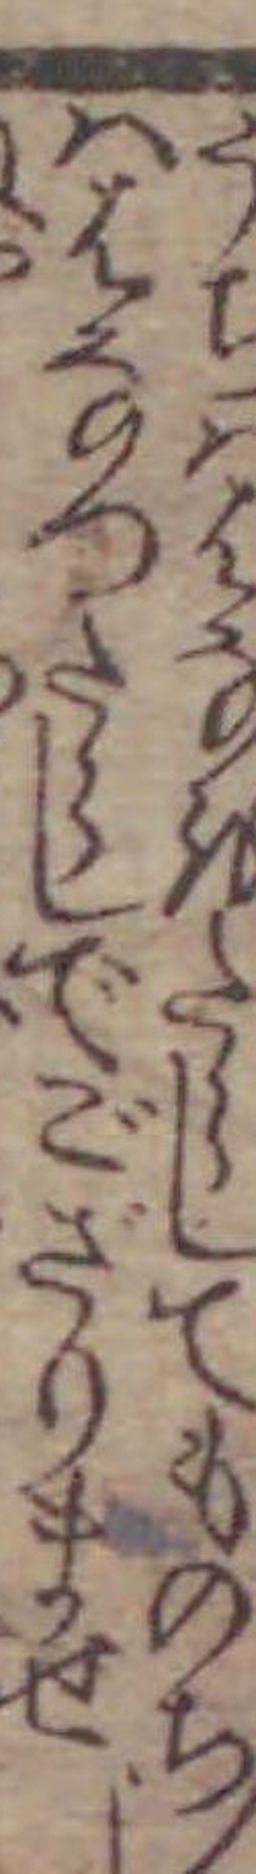ははなつたらしでござりませ
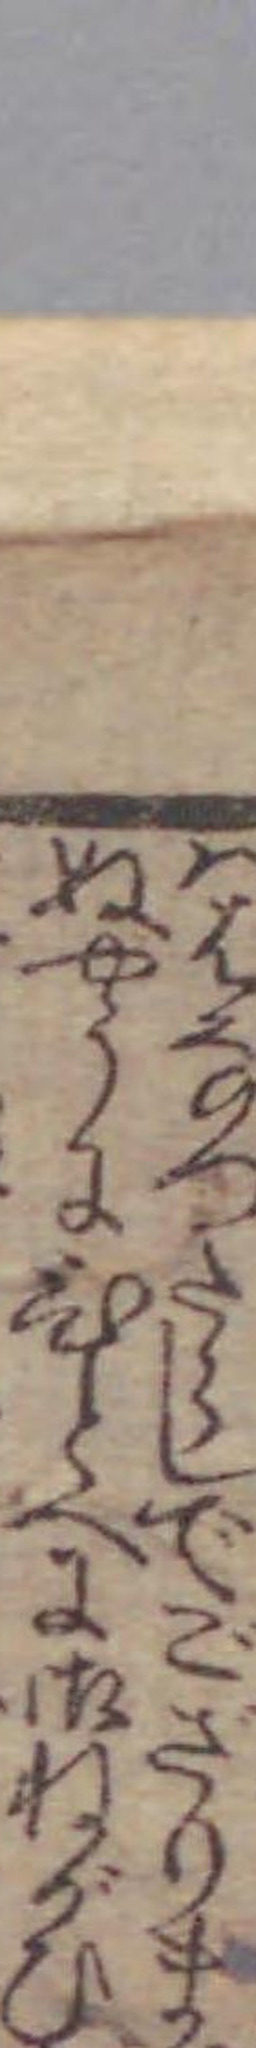ぬやうにひとへに御ねがひ申
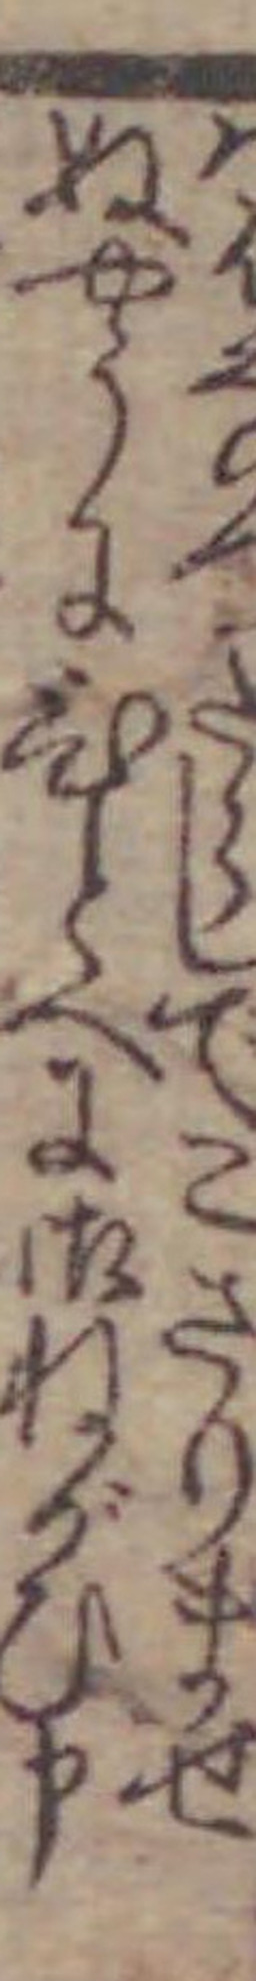ぬやうにひとへに御ねがひ申
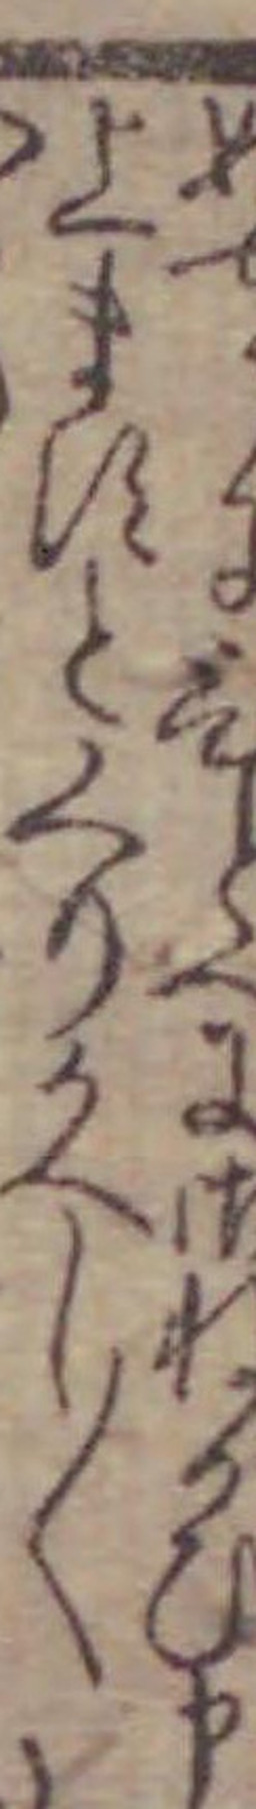上ますとくりかへし〳〵
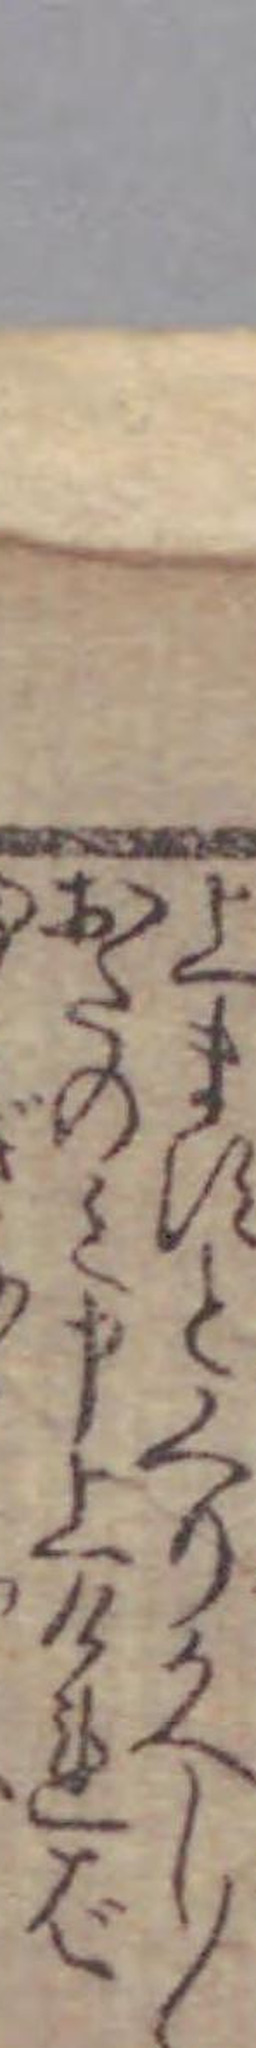おたのみ申上ければ
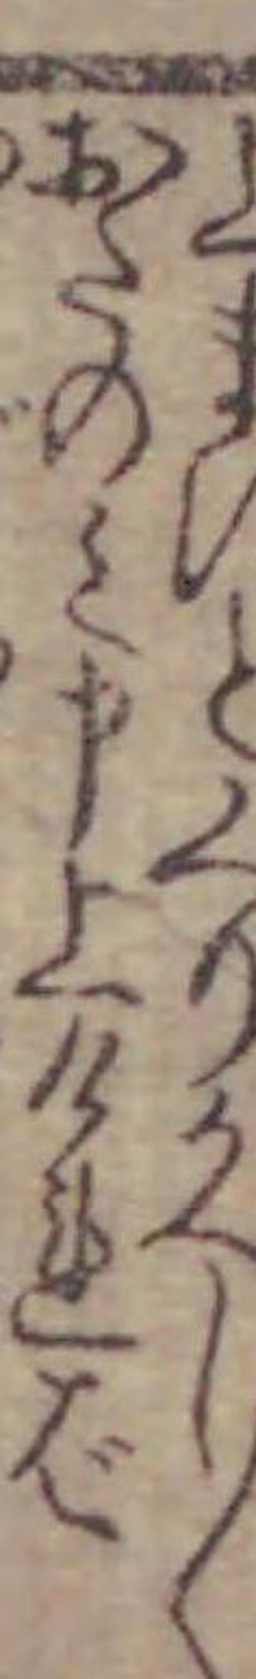おたのみ申上ければ
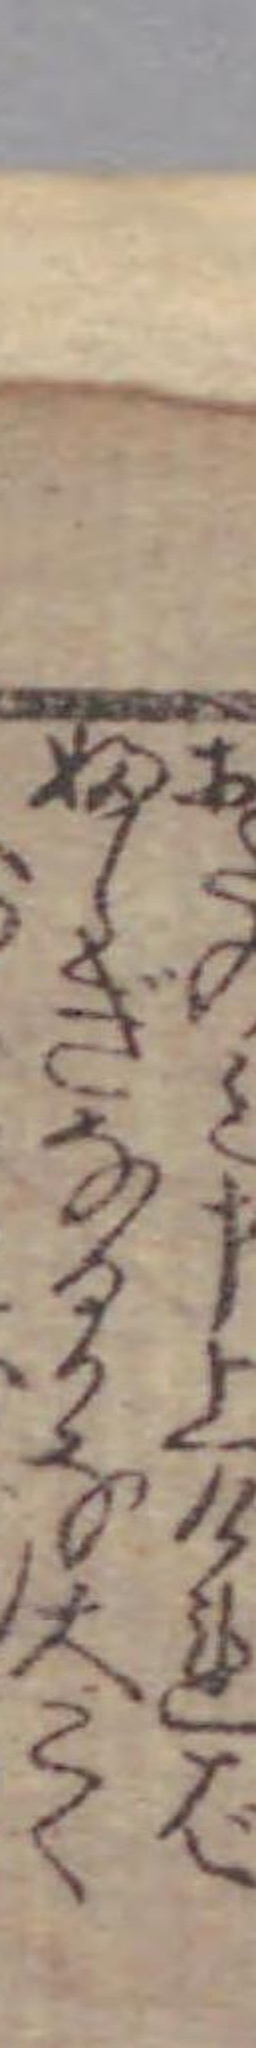ふしぎなるかな大こく
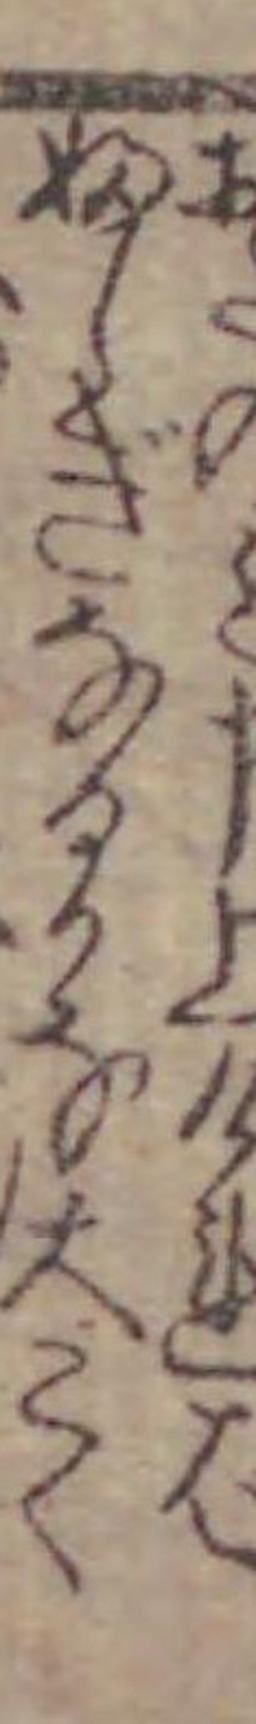ふしぎなるかな大こく
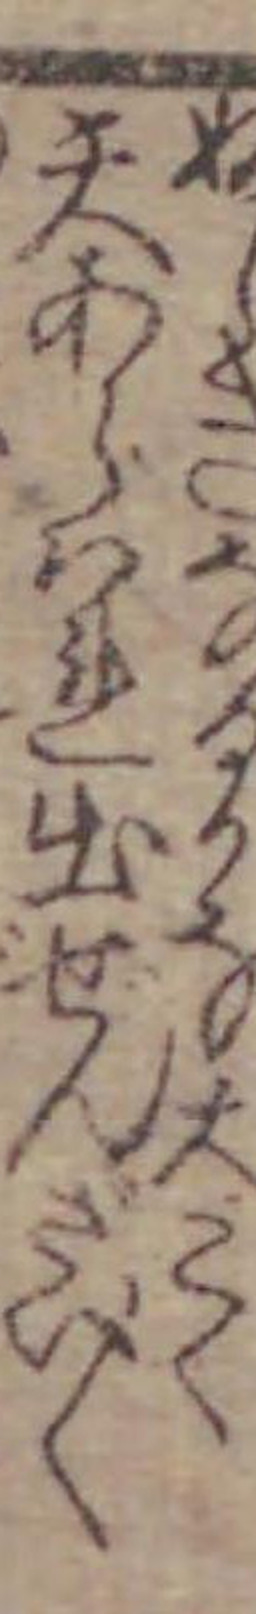天あらはれ出ぜんざい〳〵
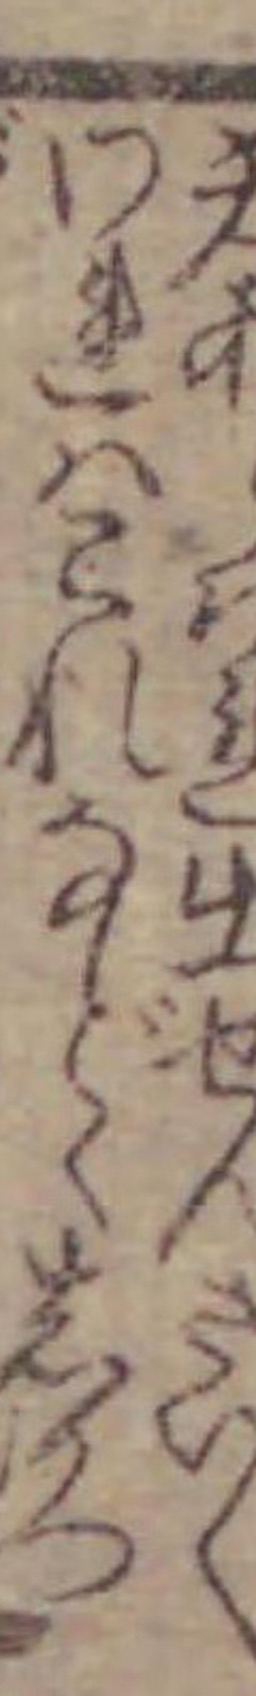われはこれなどゝしかつ
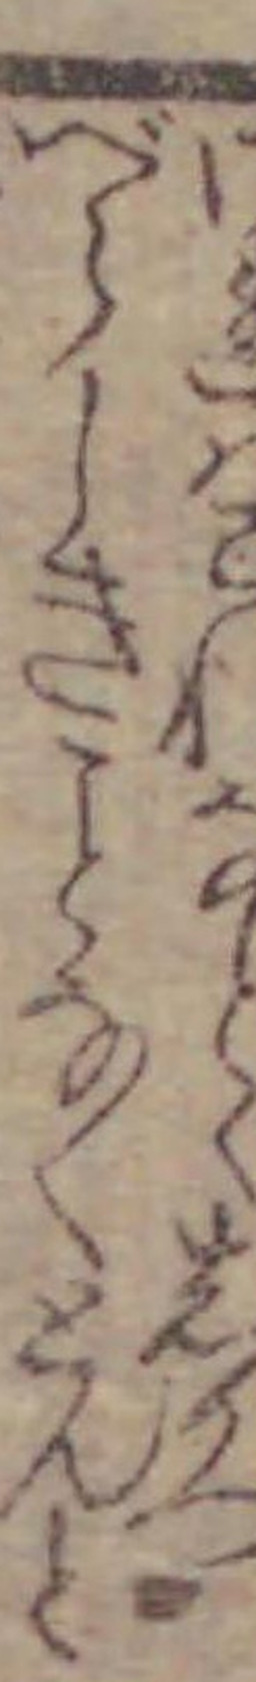べらしきことなくとんと
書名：即席耳学問 : 3巻
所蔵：国立国会図書館 National Diet Library, JAPAN
